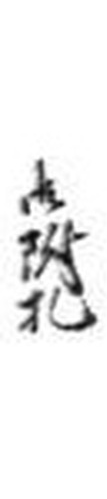御付札
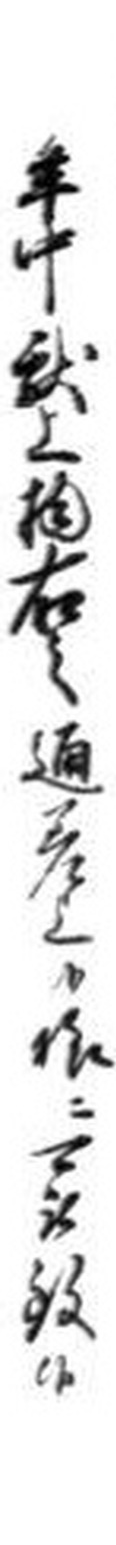年中献上物右之通差上候様ニ可被致候
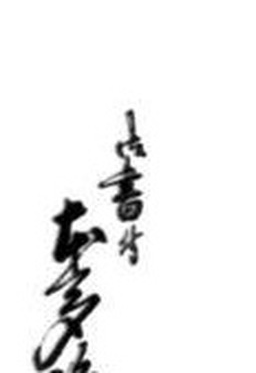御書付
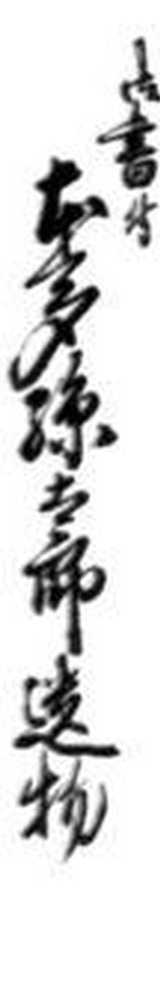本多孫太郎遺物
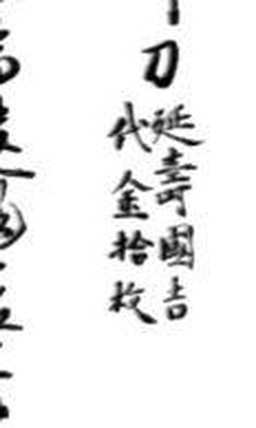代金拾枚
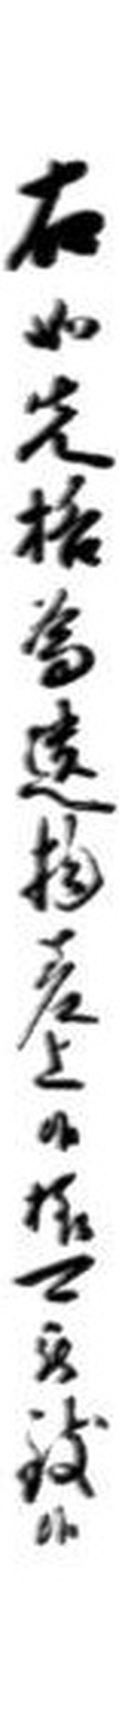右如先格為遺物差上候様可被致候
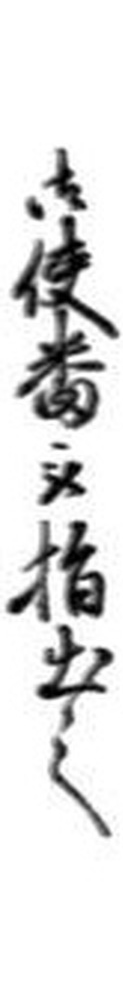御使番被指出之
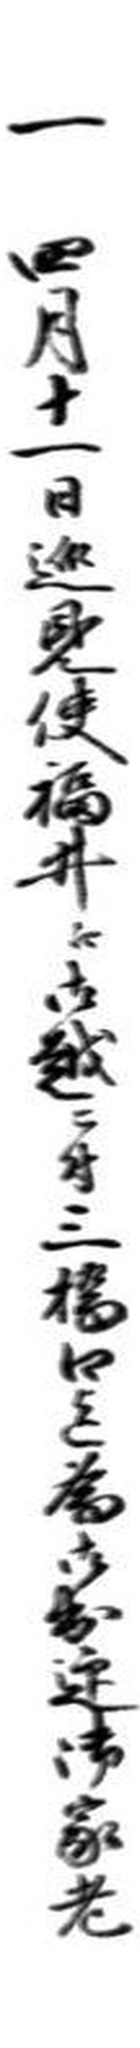一四月十一日巡見使福井江御越ニ付三橋口迄為御出迎御家老

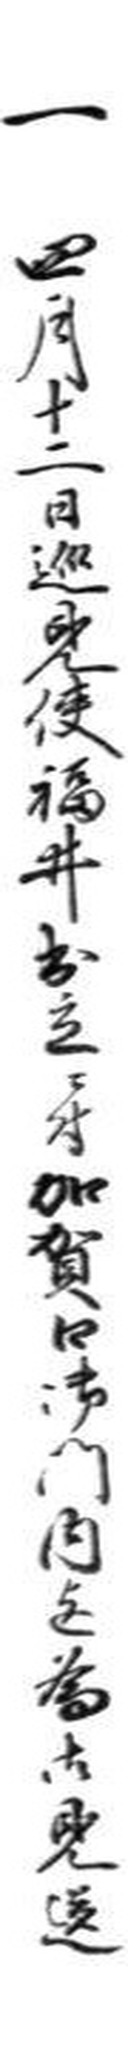一四月十二日巡見使福井出立ニ付加賀口御門内迄為御見送
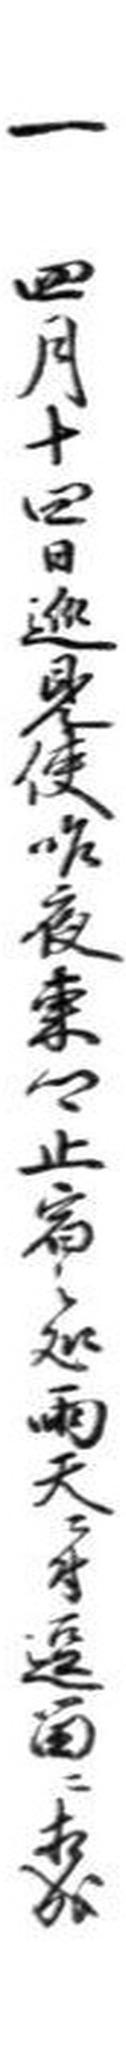一四月十四日巡見使昨夜棗郷止宿之処雨天ニ付逗留ニ相成
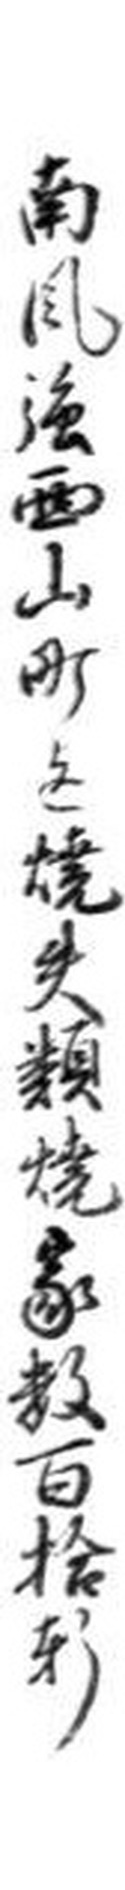南風強西山町迄焼失類焼家数百拾軒
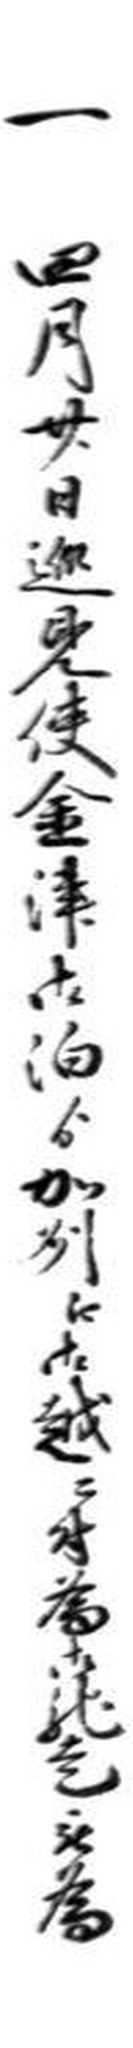一四月廿日巡見使金津御泊ゟ加州江御越ニ付為御馳走被為
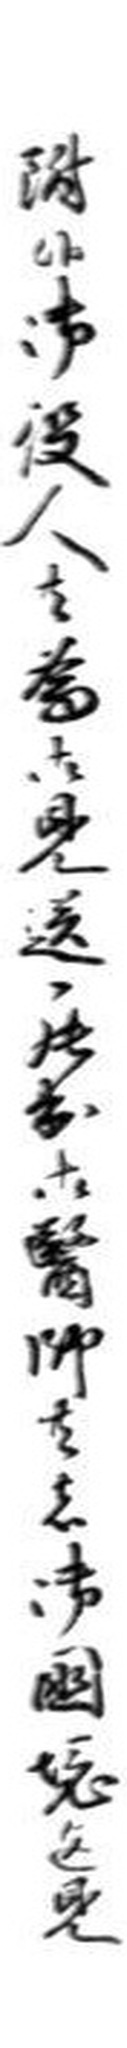付候御役人共為御見送罷出御医師共者御国境迄見
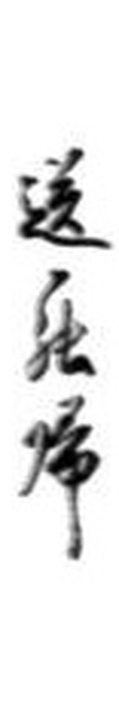送罷帰
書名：家譜 三十二 吉邦公 従享保二年到享保三年
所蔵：福井県文書館 Fukui Prefectural Archives
